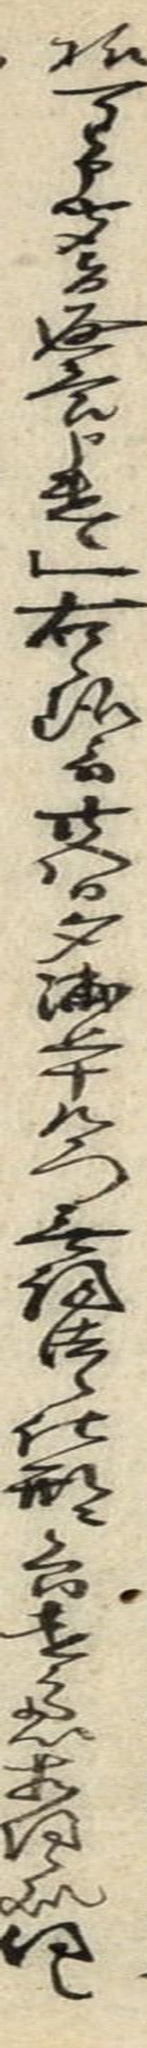様可被申聞旨返答申遣候」右之趣に付廿八日夕浦上十左衛門無調法之仕形に候間遠慮相伺候処伺之
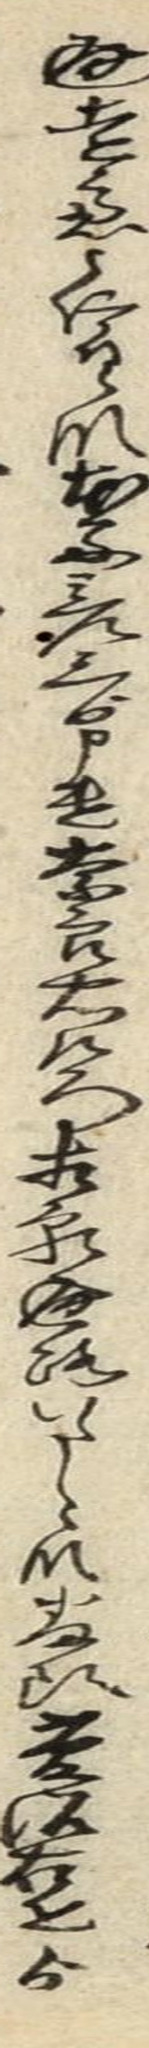通遠慮被仰付候段本多彦三ゟ申遣奈良忠左衛門相願通路いたし候段番頭菅沼右近ゟ
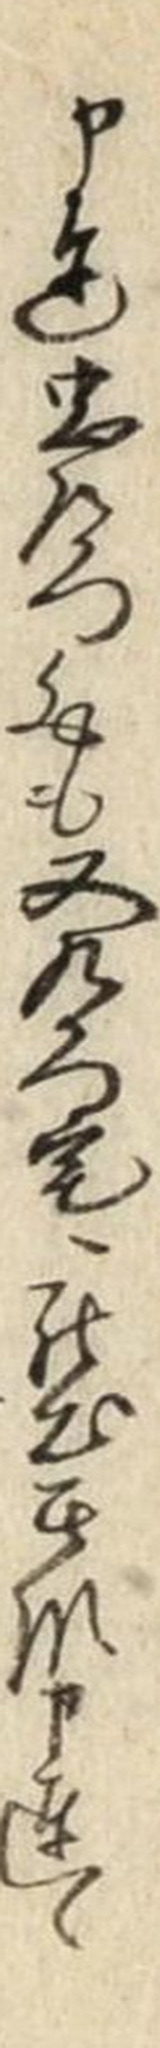申達忠左衛門儀も又左衛門宅へ罷出其段申達候
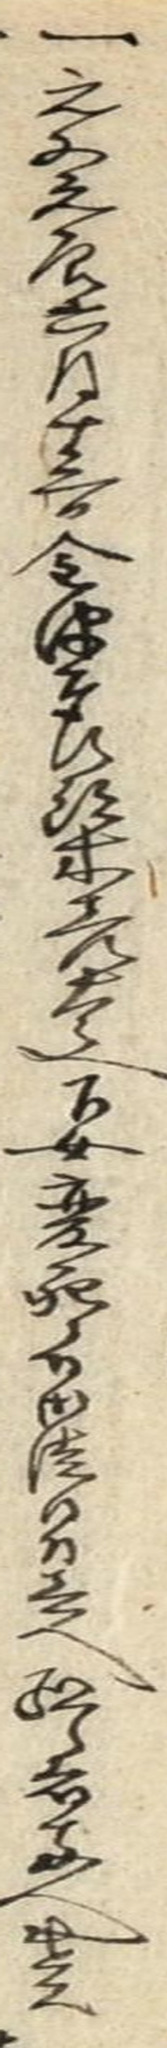一元文元辰六月十三日金津奉行鈴木彦大夫下女変死に付御徒目付壱人組之者両人遣ス
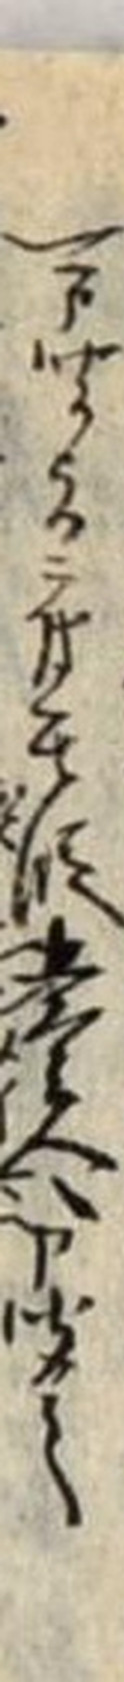可申聞旨に付其段五大夫へ申聞之

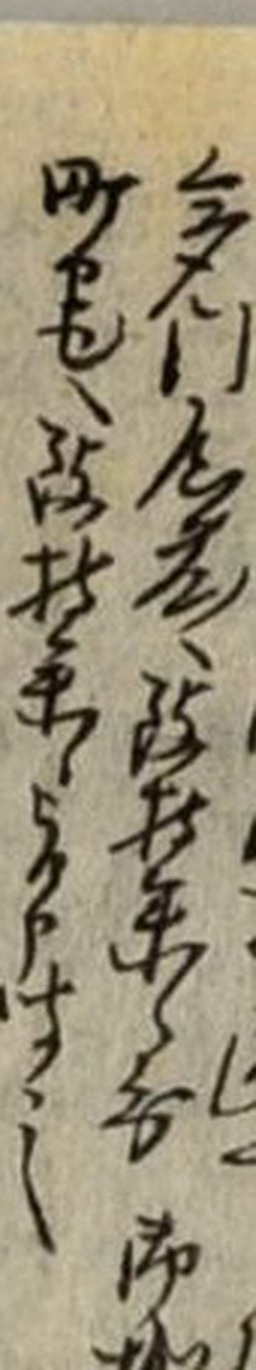町宅へ致持参候旨申聞之

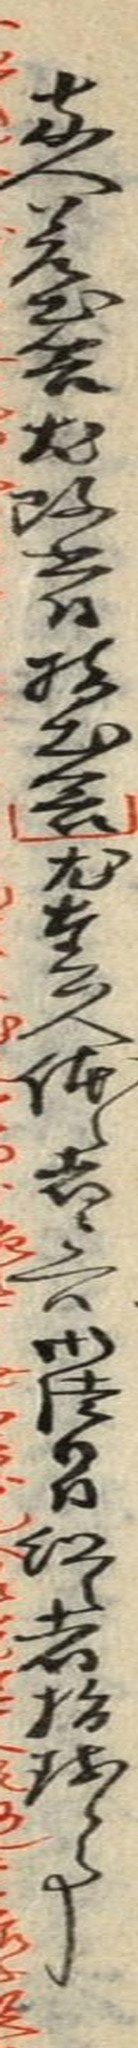両人差出筈尤改書付指出筈」尤奉公人体之者に候へは御徒目付組之者指越候事
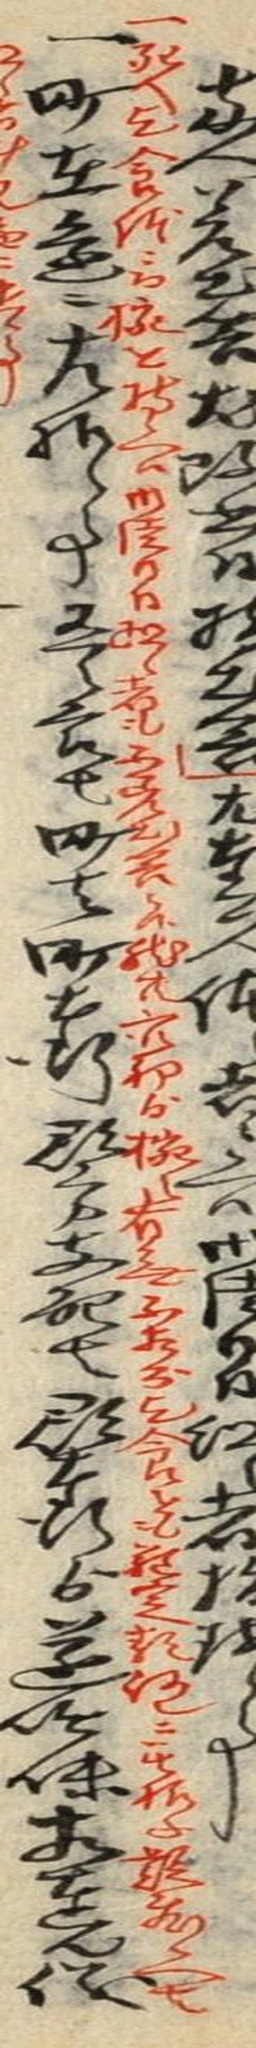一町在辺に左様之事有之節は町は町奉行郡方支配は郡奉行ゟ遂吟味相達ル儀
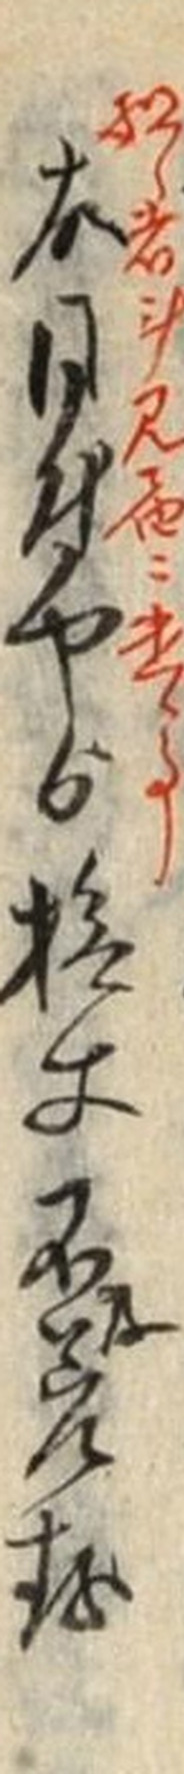故目付中ゟ検使不及差越
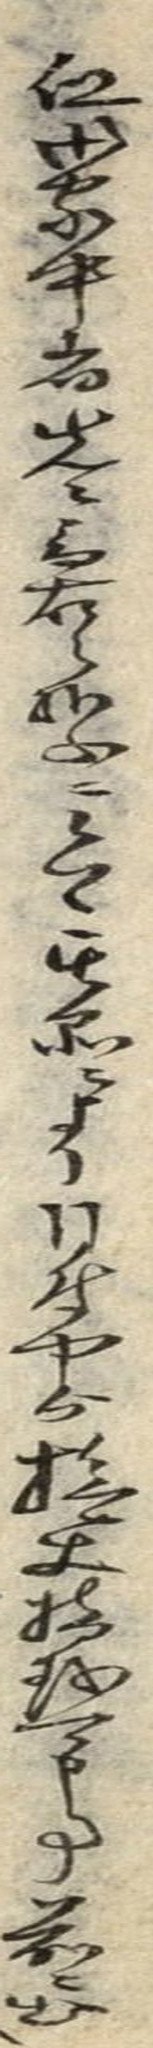但御家中者先々にて右之様子に候はゝ其品により目付中ゟ検使指越可申事前に出之
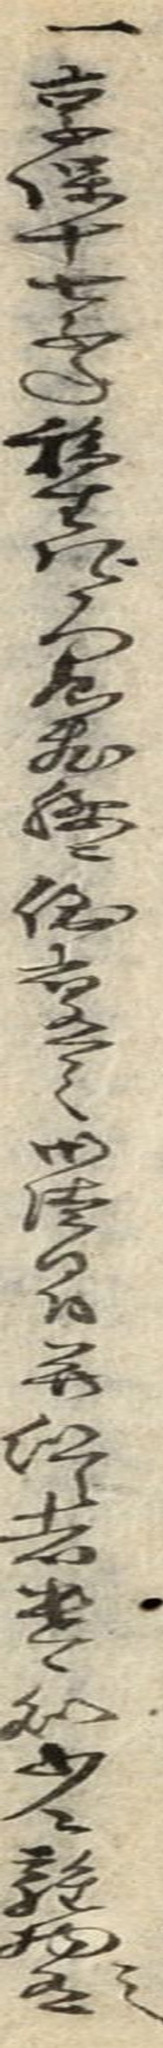一享保十七子年稲生八郎右衛門屋敷腰に倒者有之御徒目付并組之者遣候処少々雑物有
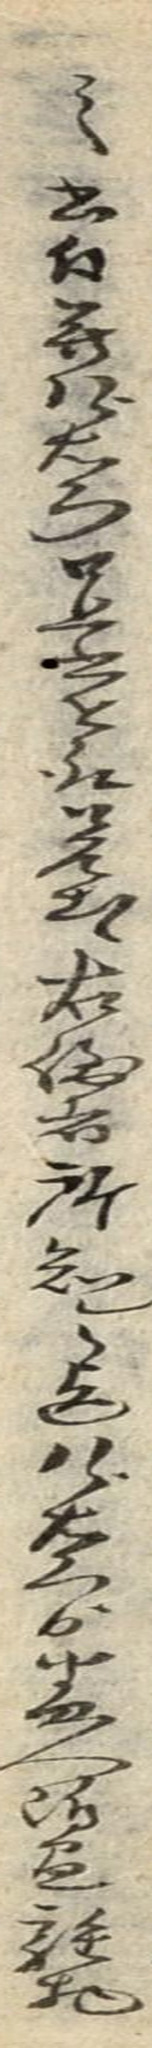之書付并八郎右衛門口上書を取差出候右倒者所知レ候迄八郎右衛門ゟ番人附置雑物
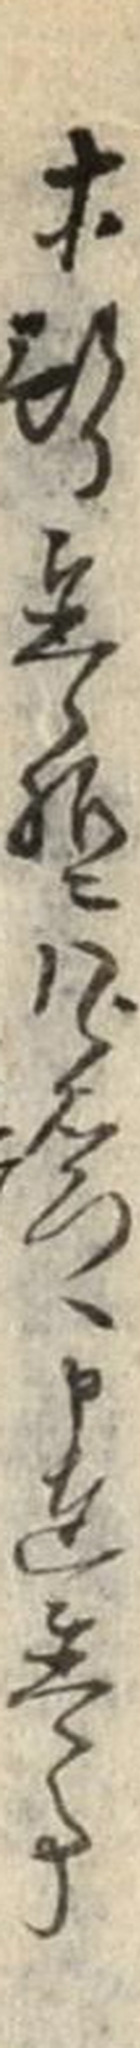等預り置候様に八郎右衛門へ申達置候事
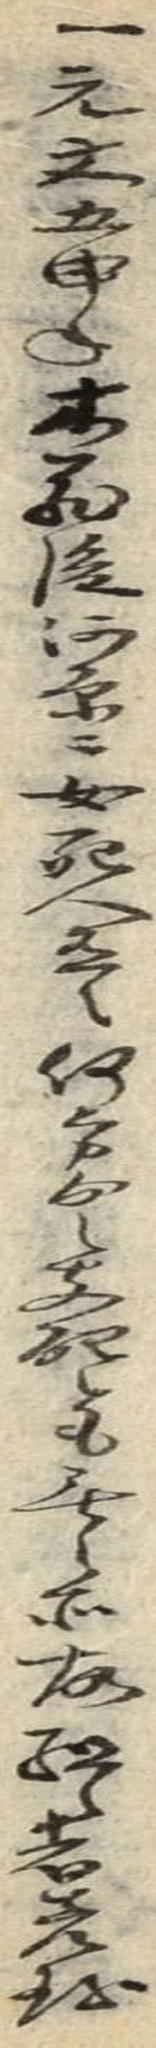一元文五申年木蔵後河原に女死人有之何方ゟ之支配とも無之所故組之者差越
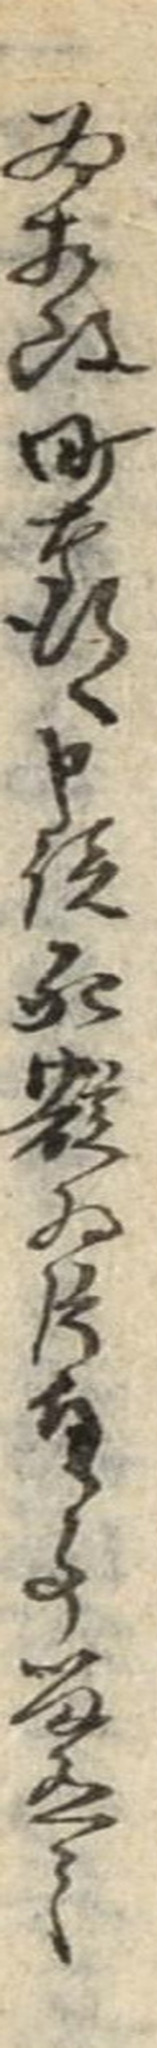為相改町奉行へ申談死骸為片付候事留有之
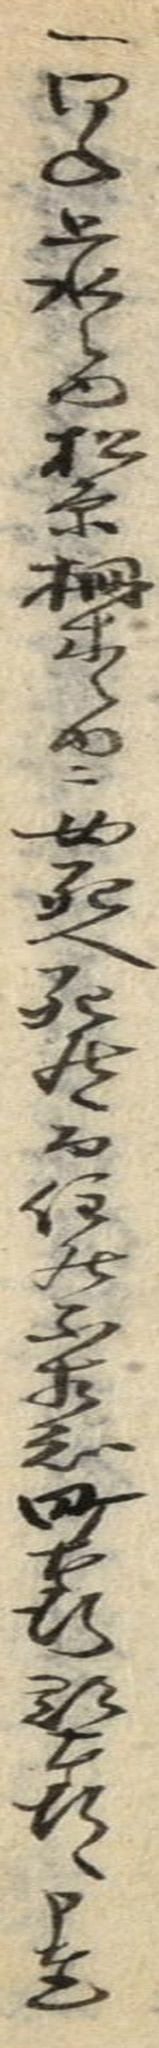一同年上水之内松原棚木之内に女死人死居候て住居不相知町奉行郡奉行へ申達
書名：御停止異変死失
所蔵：福井県文書館 Fukui Prefectural Archives
